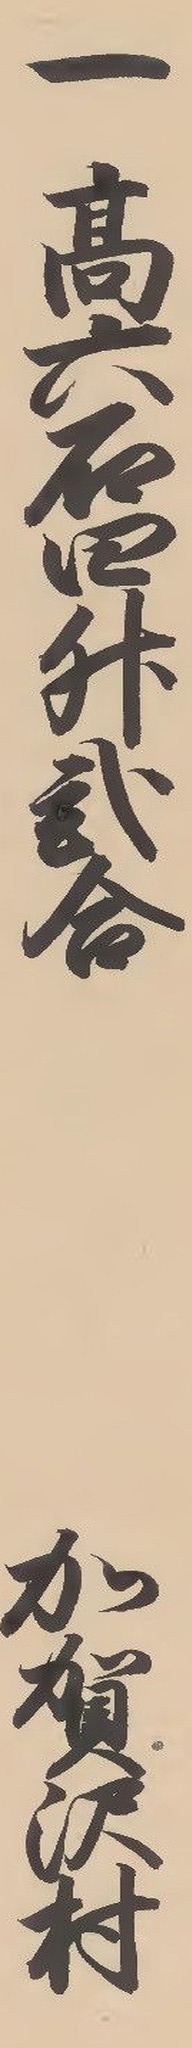一高六石四升弐合加賀沢村
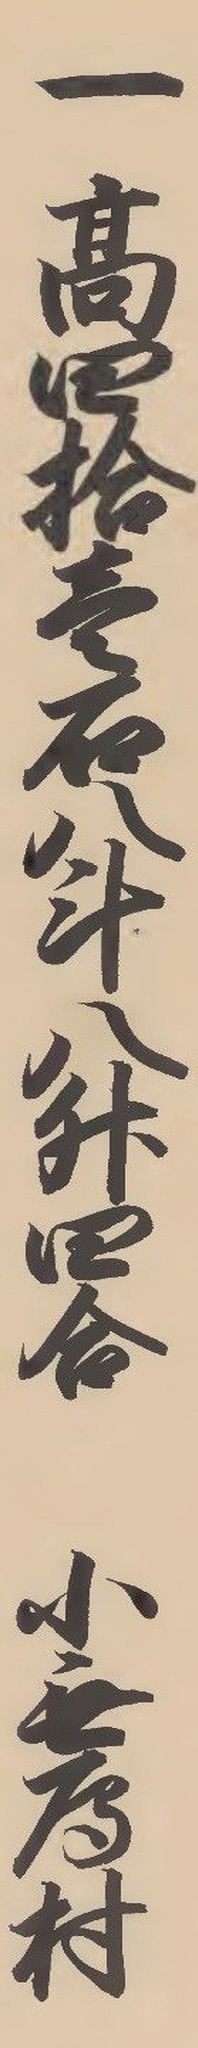一高四拾壱石八斗八升四合小無雁村
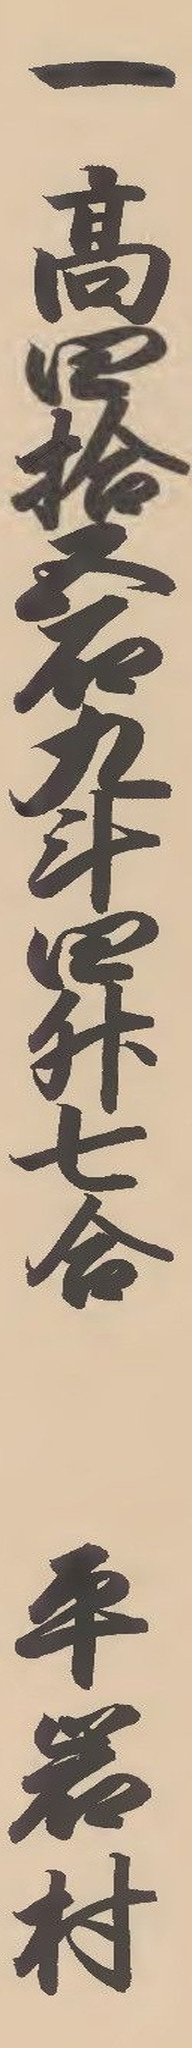一高四拾五石九斗四升七合平岩村
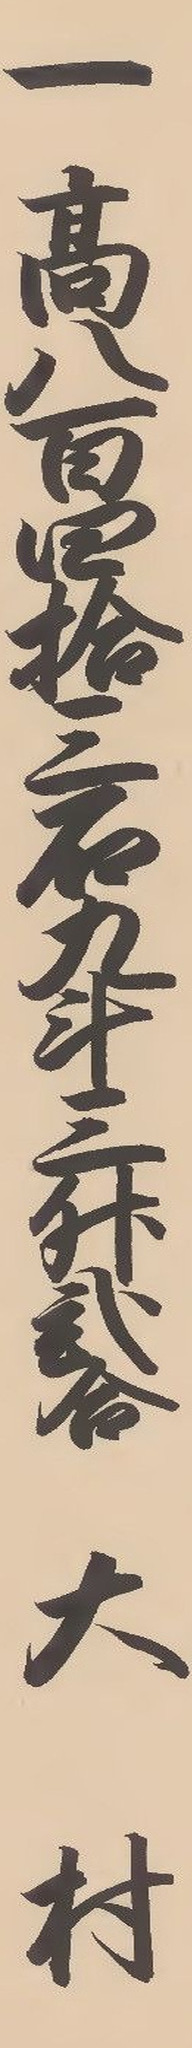一高八百四拾三石九斗三升弐合大村
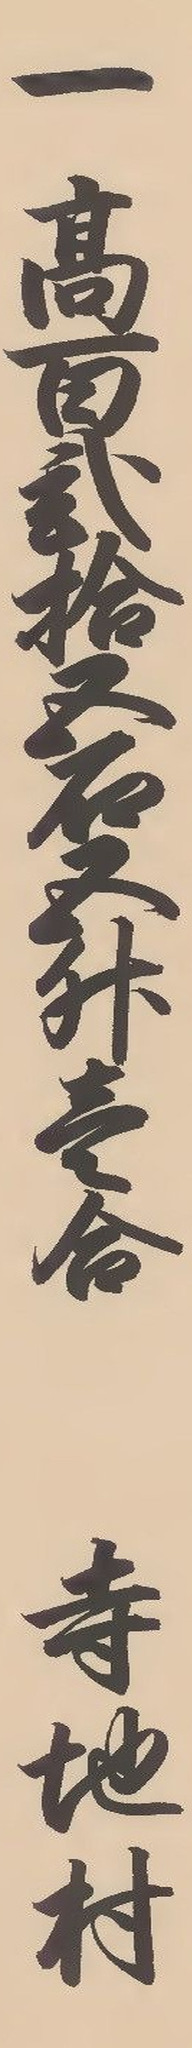一高百弐拾五石五升壱合寺地村
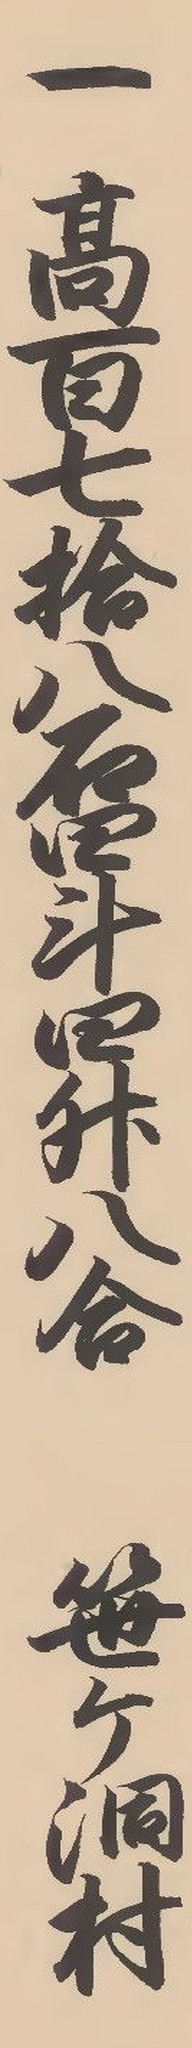一高百七拾八石四斗四升八合笹ヶ洞村
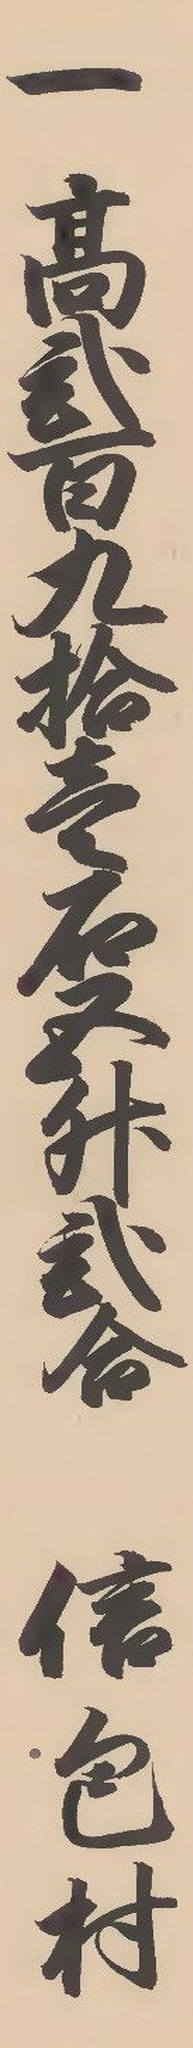一高弐百九拾壱石五升弐合信包村

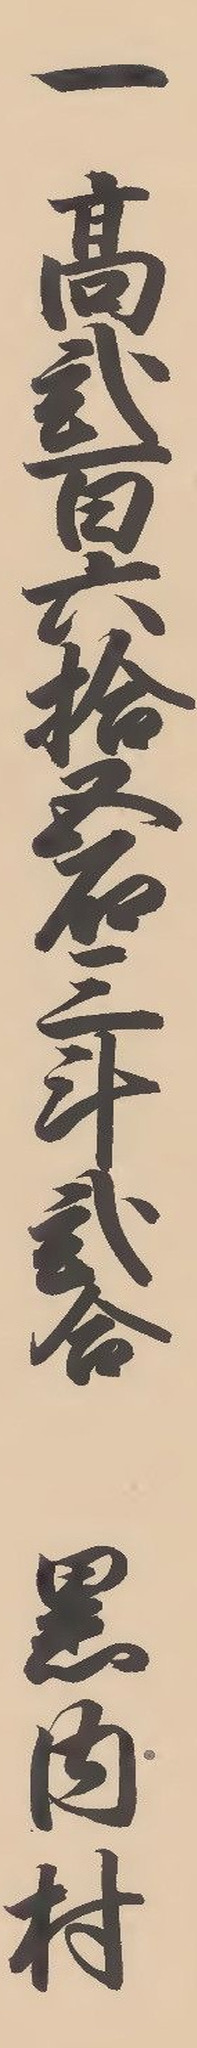一高弐百六拾五石三斗弐合黒内村
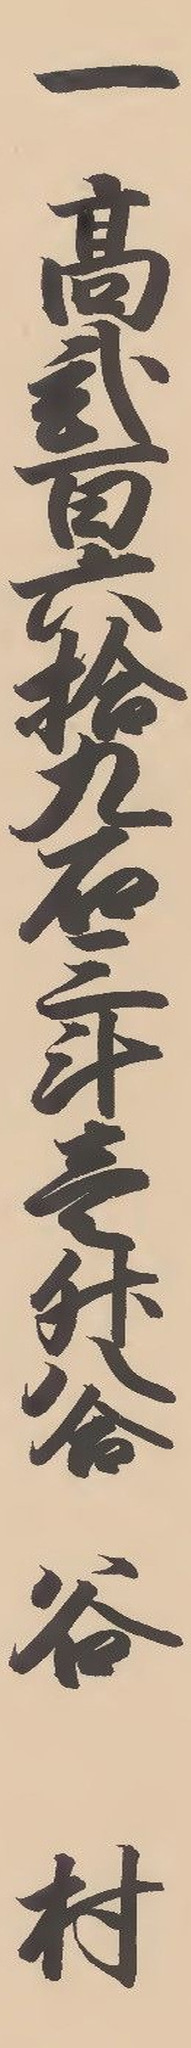一高弐百六拾九石三斗壱升八合谷村
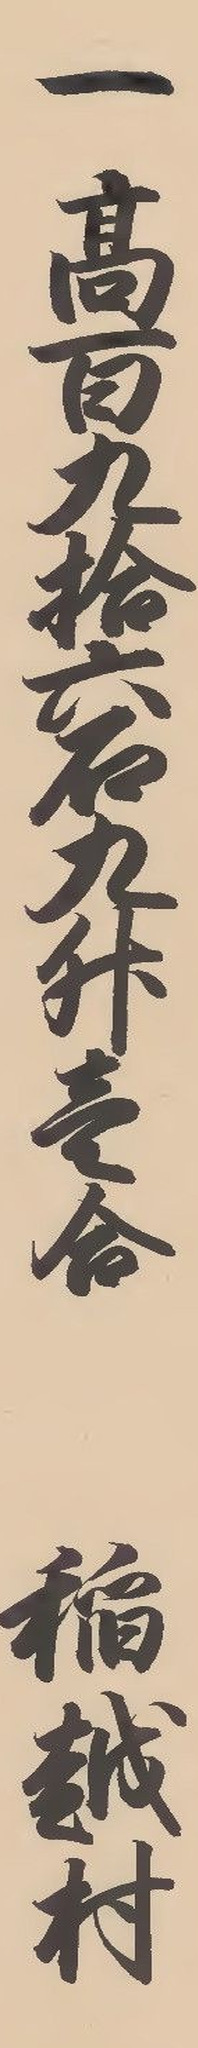一高百九拾六石九升壱合稲越村
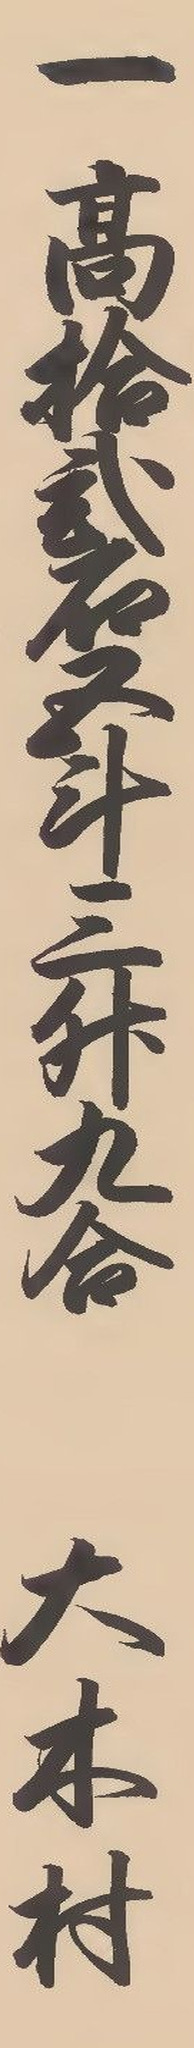一高拾弐石五斗三升九合大木村
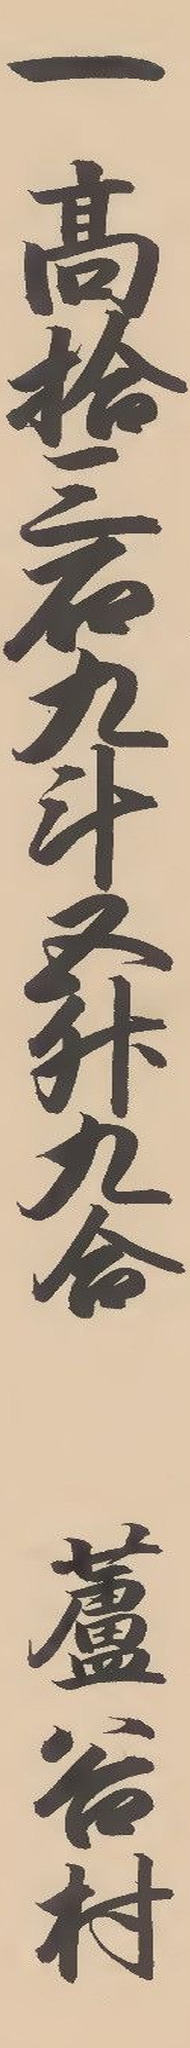一高拾三石九斗五升九合蘆谷村
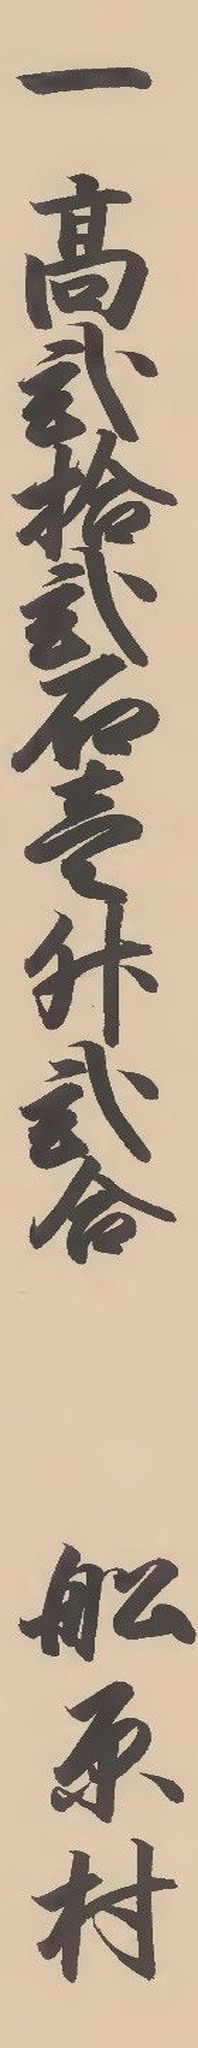一高弐拾弐石壱升弐合船原村
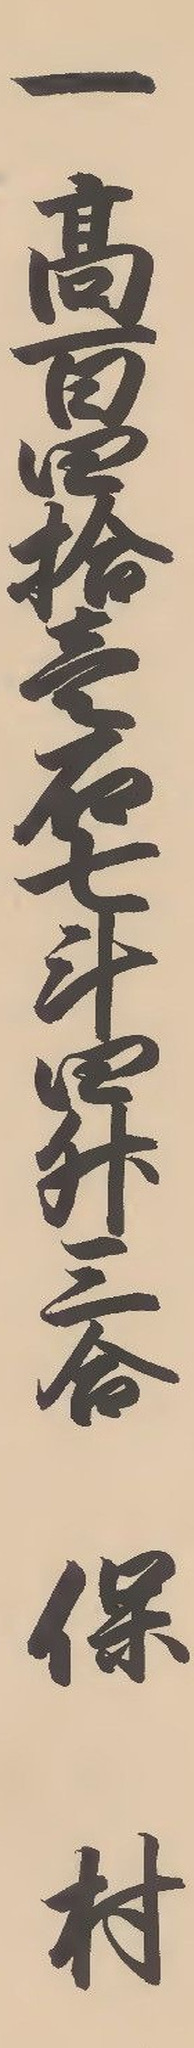一高百四拾壱石七斗四升三合保村
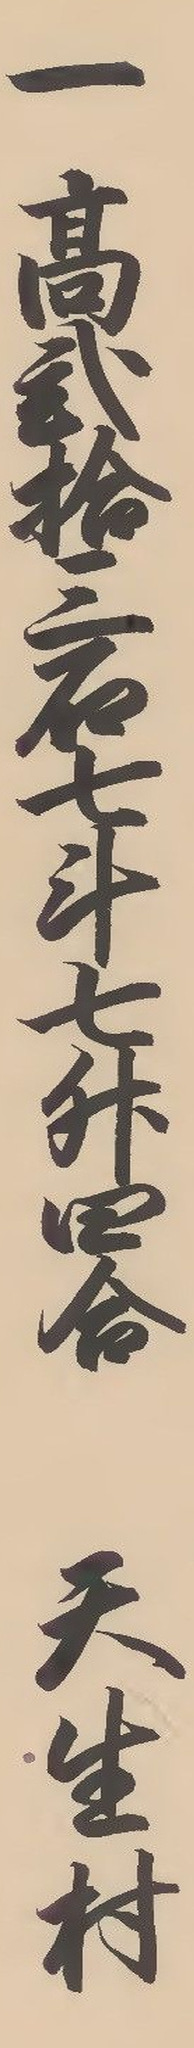一高弐拾三石七斗七升四合天生村

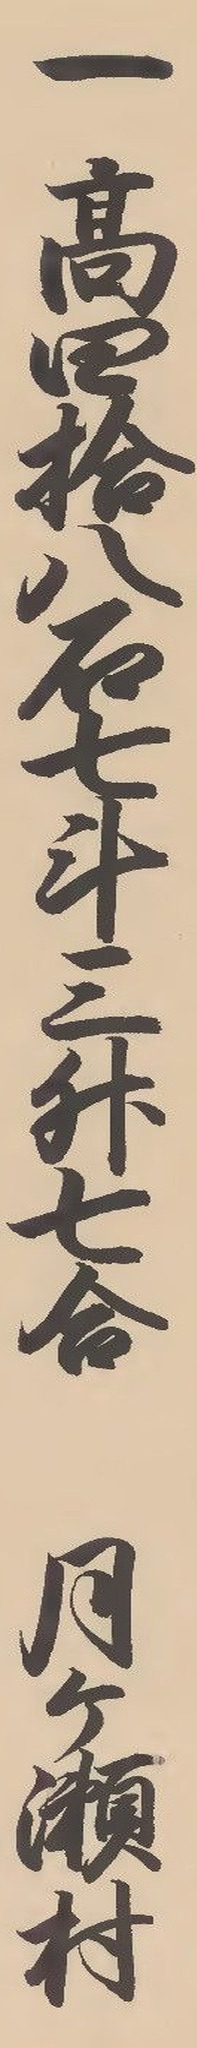一高四拾八石七斗三升七合月ヶ瀬村
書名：飛騨国郷帳
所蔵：国立公文書館 National Archives of Japan
